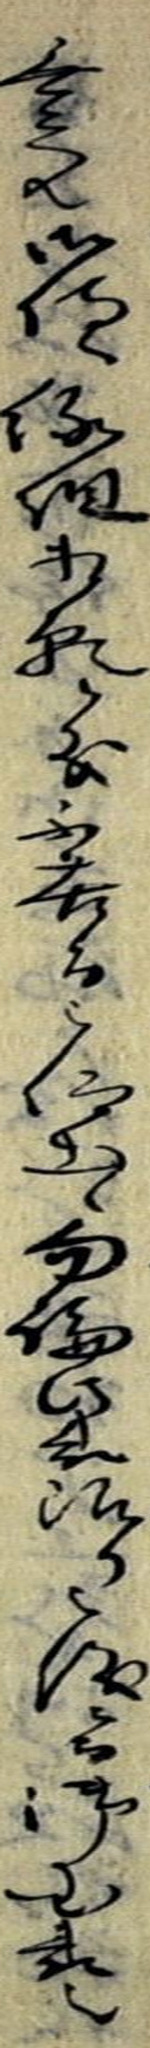無之共御侍へ縁組相願候義不苦旨被仰出候勿論此表限り之儀ニ而御国表之
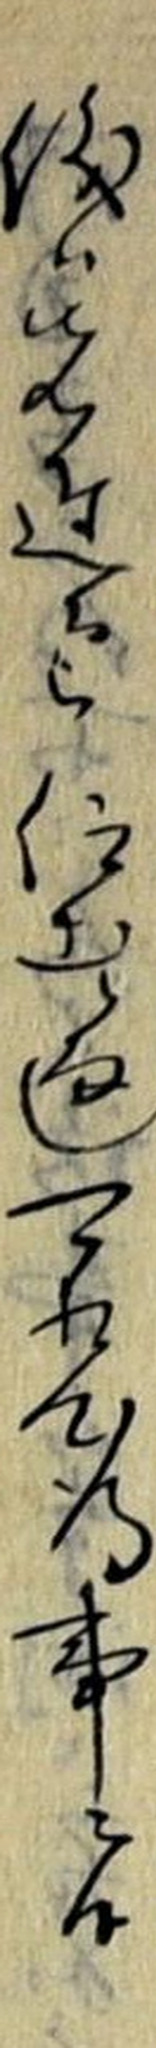儀ハ先達而被仰出候通可相心得事ニ候
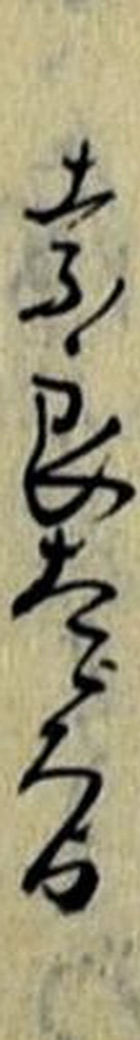同奈良太郎右衛門
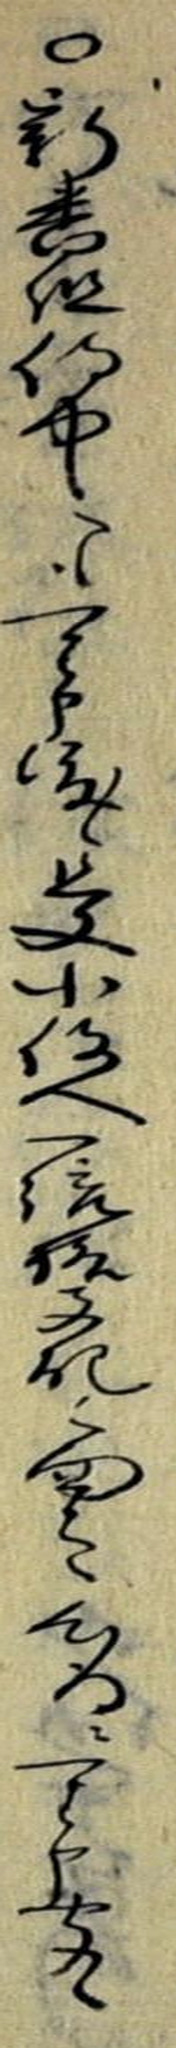〇新番組侍中へも可被申渡候且又小役人一統格支配之面々へ心得ニ可被申聞候
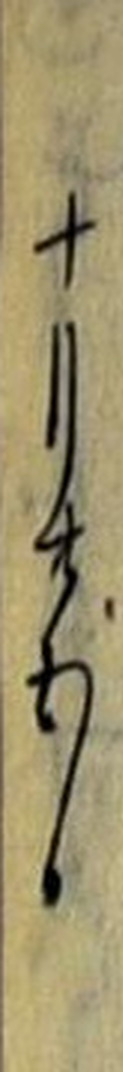十月廿五日
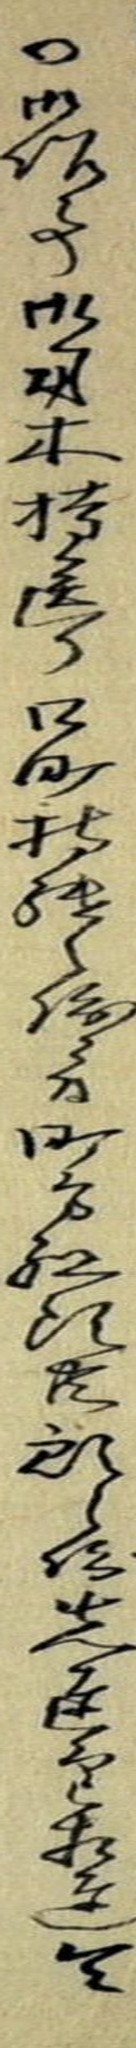〇御作事御用木持送り口町持継之儀ニ付町方組頭共願之儀先達而被相達令
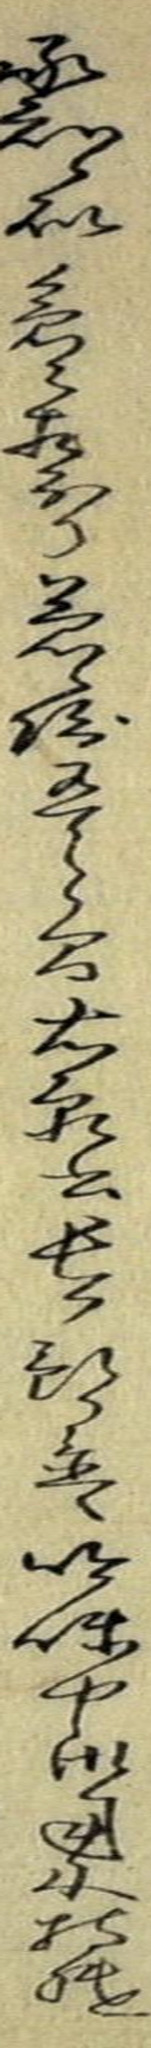承知候処急ニ相分り兼之儀有之候間右願書長ク預り置候吟味中御用木持継
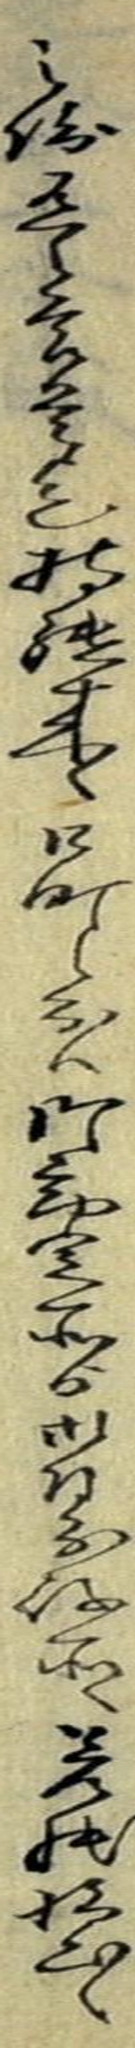之儀有之節是迄持継来候口町之分ハ御勘定所ゟ御自分役所へ差紙指出候
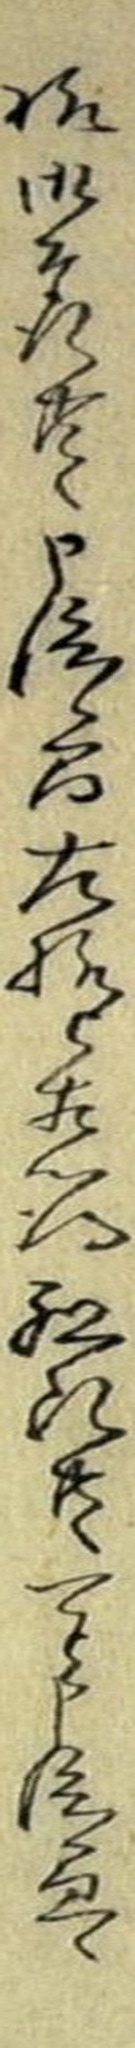様御奉行共へ申渡候間左様被相心得組頭共へ可被申渡置候
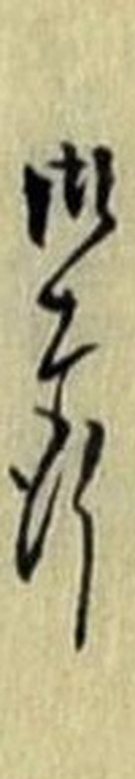御奉行
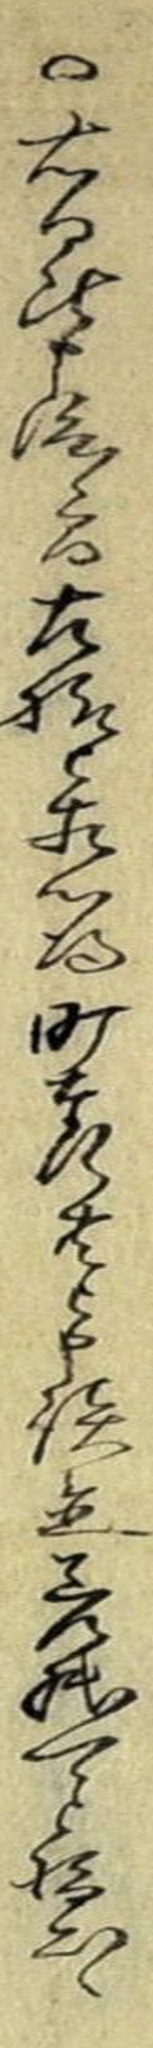〇右同断申渡候間左様被相心得町奉行共被申談置差紙可被指出候
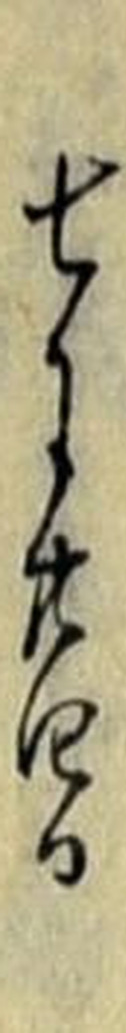七月廿四日
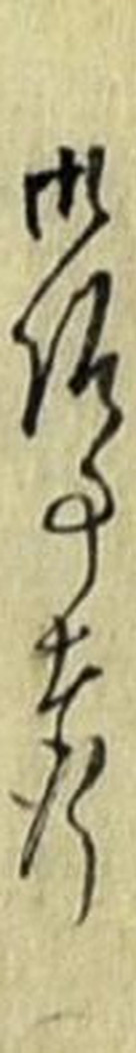御作事奉行
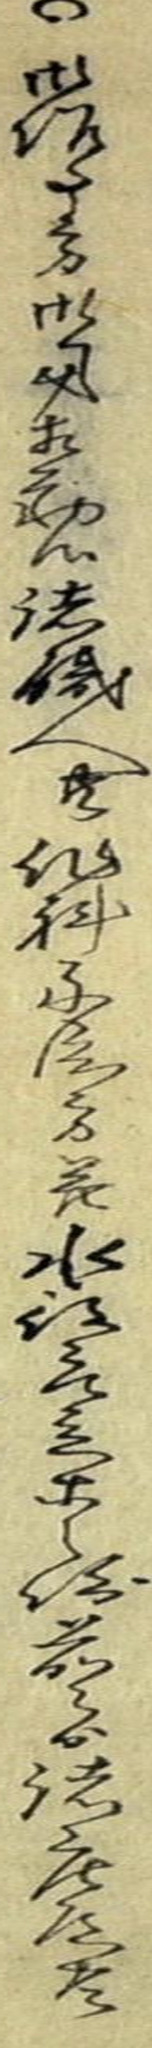〇御作事方御用相勤候諸職人共作料米渡方并水役取立等之儀前々ゟ諸庄屋共ニ
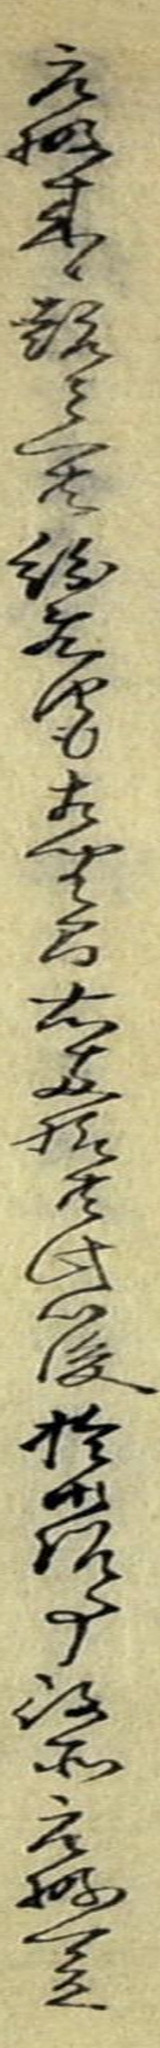取扱来候趣ニ候へ共紛敷儀も相聞候間右両様共此以後於御作事役所取扱可有
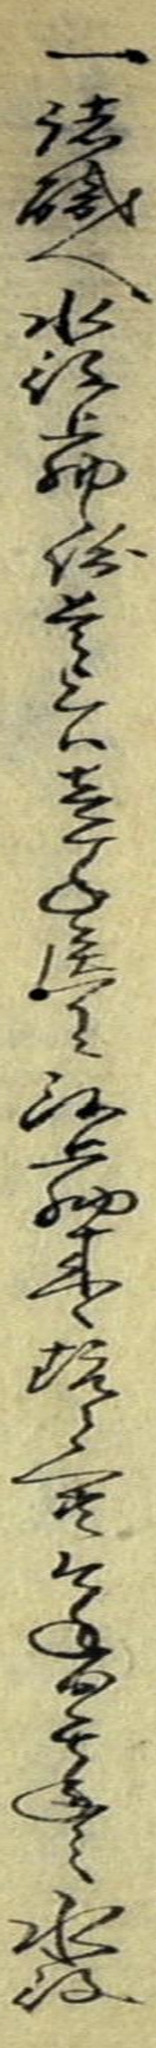一諸職人水役上納之儀是迄ハ壱ケ年送りニ致上納来候趣ニ候へ共今年ゟ其年々水役
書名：命令之部 三
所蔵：福井県文書館 Fukui Prefectural Archives
